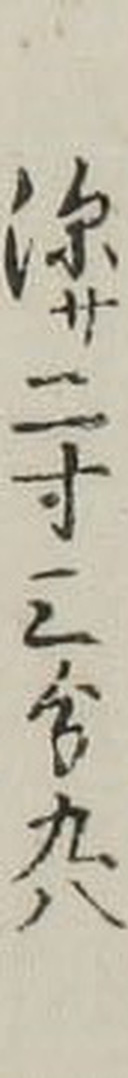深二寸三分九八
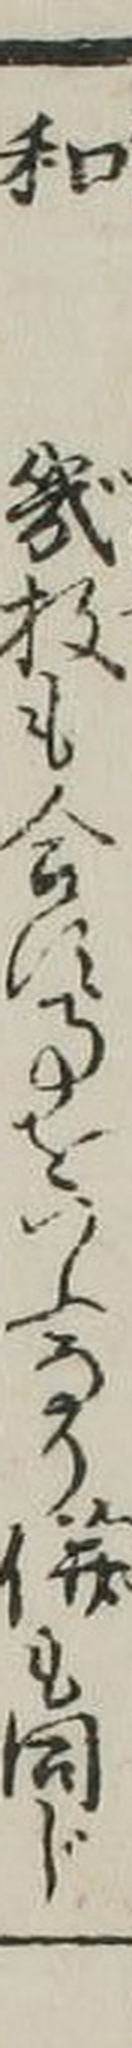和幾数も合す事をいふなり併も同じ
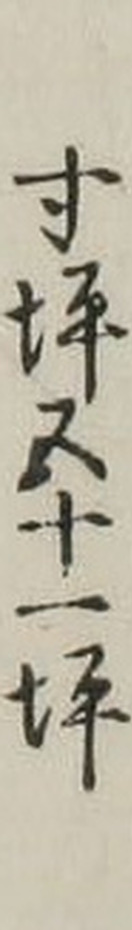寸坪五十一坪
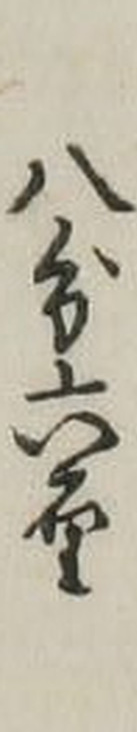八分六厘
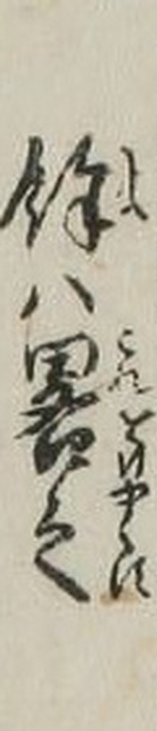余は略之
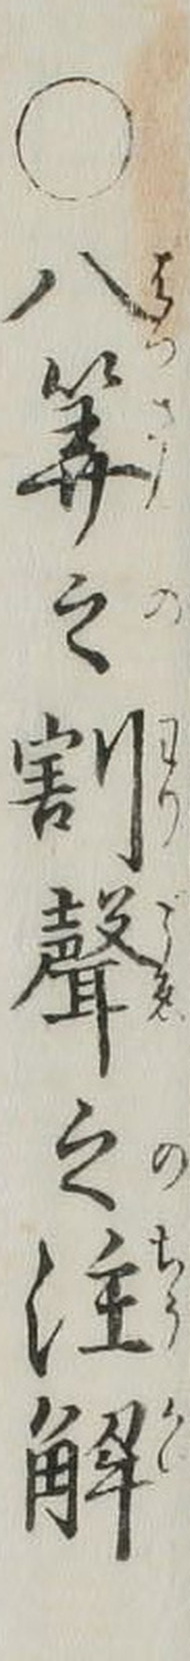○八算之割声之注解
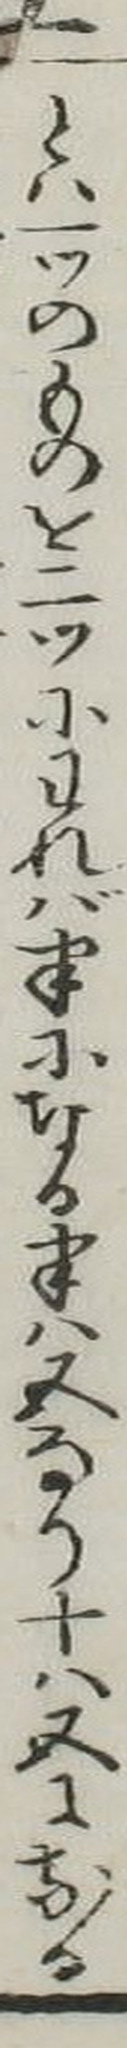二一天作五とは一ツのものを二ツにわれば半になる半は五なり十は五になる
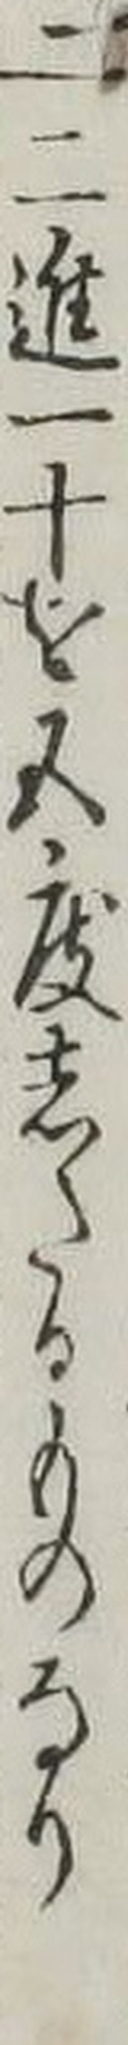二進一十を五度したるものなり
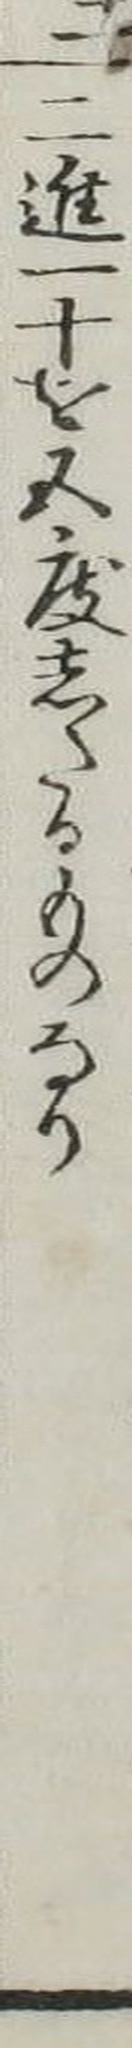二進一十を五度したるものなり
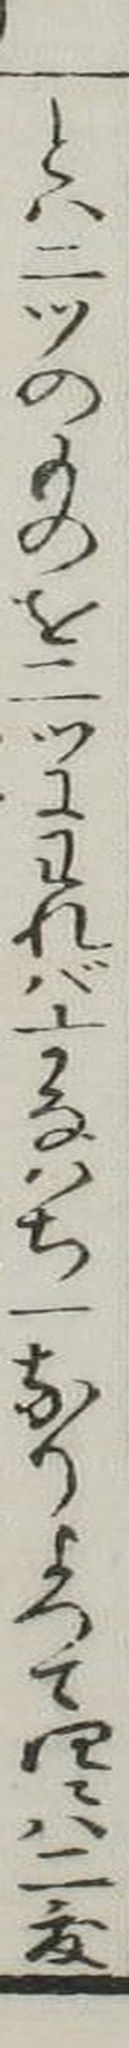二進一十とは二ツのものを二ツにわればすなはち一なりよつて四には二度
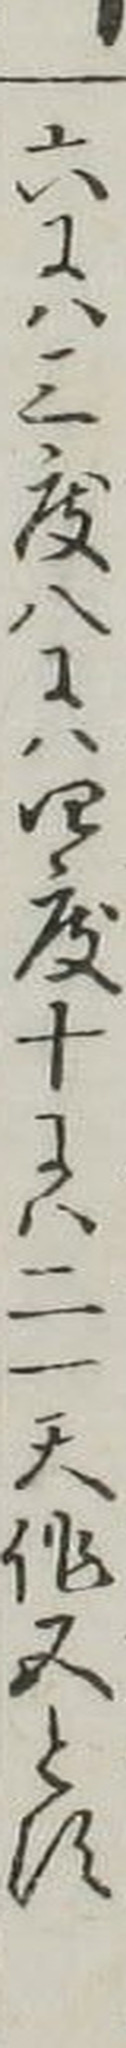六には三度八には四度十には二一天作五とす
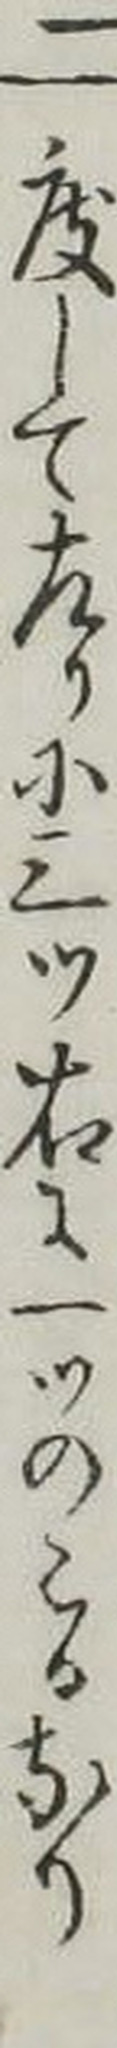度して左りに三ツ右に一ツのこるなり
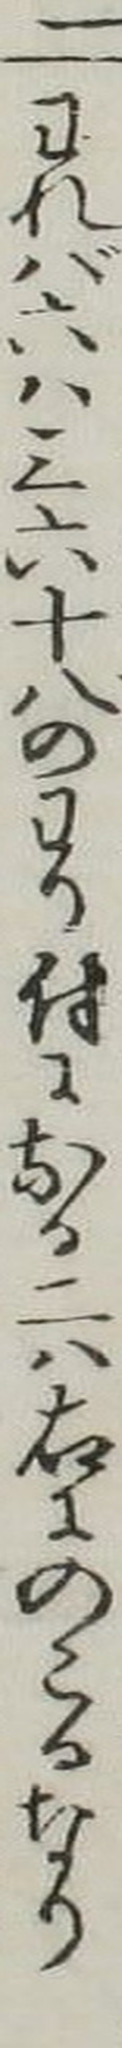われば六は三六十八のわり付になる二は右にのこるなり
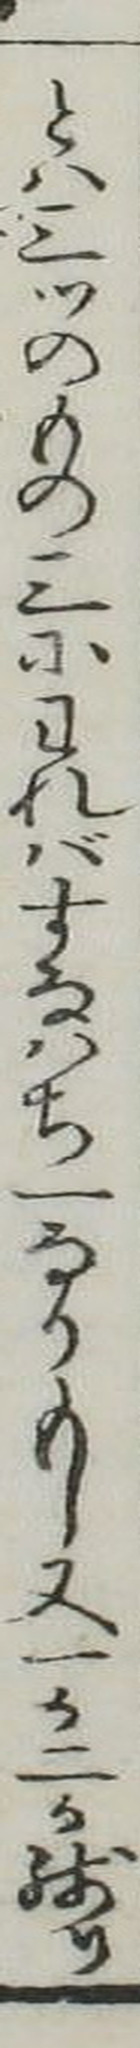三進一十とは三ツのもの三にわればすなはち一なりもし又一か二か残り
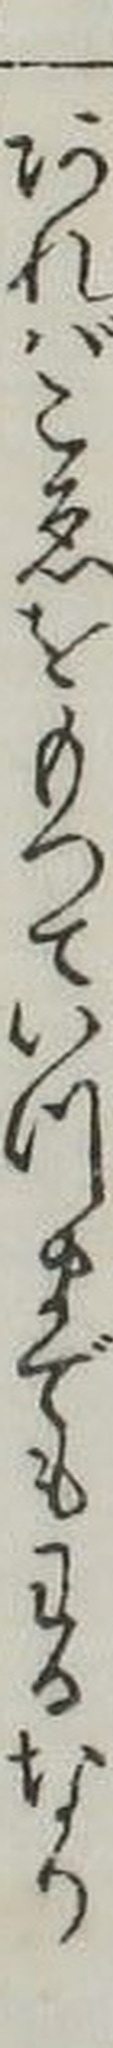あればこゑをもつていつまでもわるなり
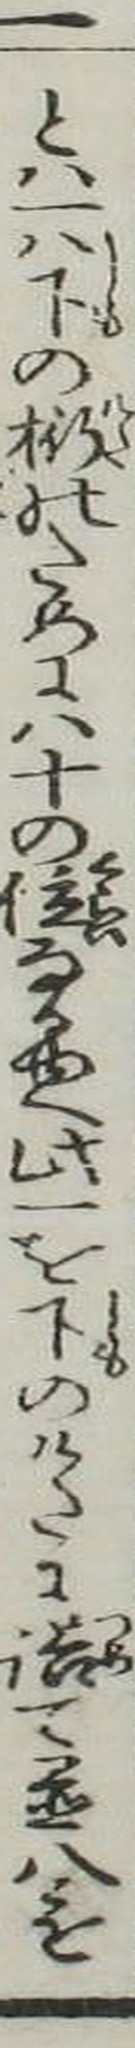四一二十二とは一は下の桁のためには十の位なるゆへ此一を下のけたに詰て置八を
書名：宝玉塵劫記
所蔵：東京学芸大学教育コンテンツアーカイブ
